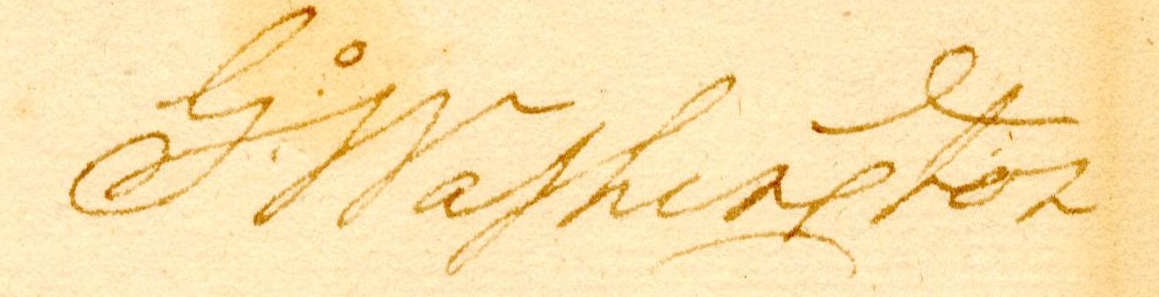G^o: Washington
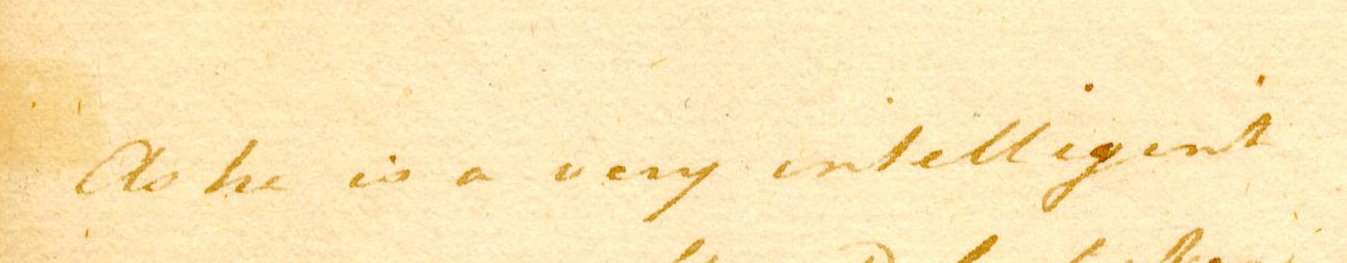As he is a very intelligent
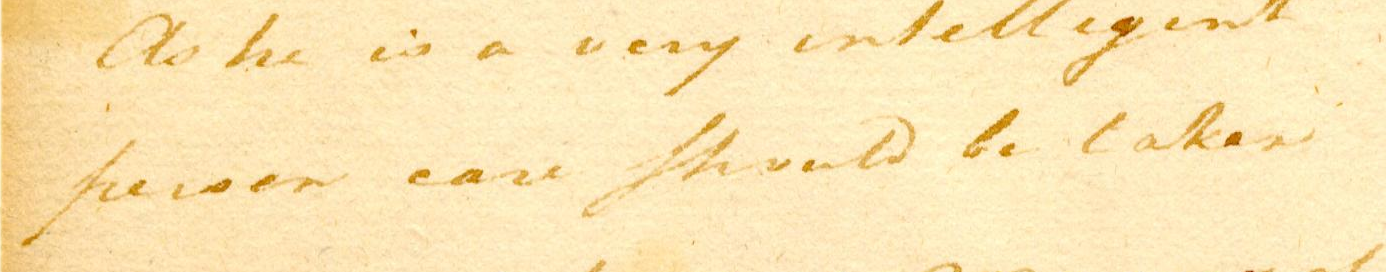person care should be taken
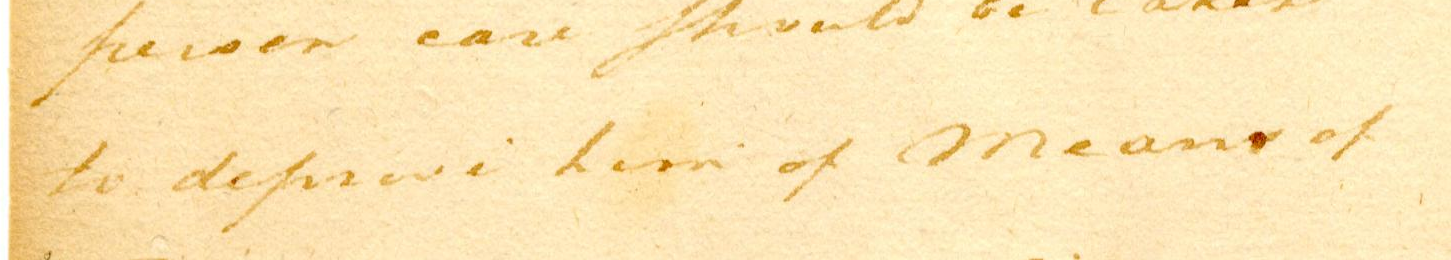to deprive him of means of
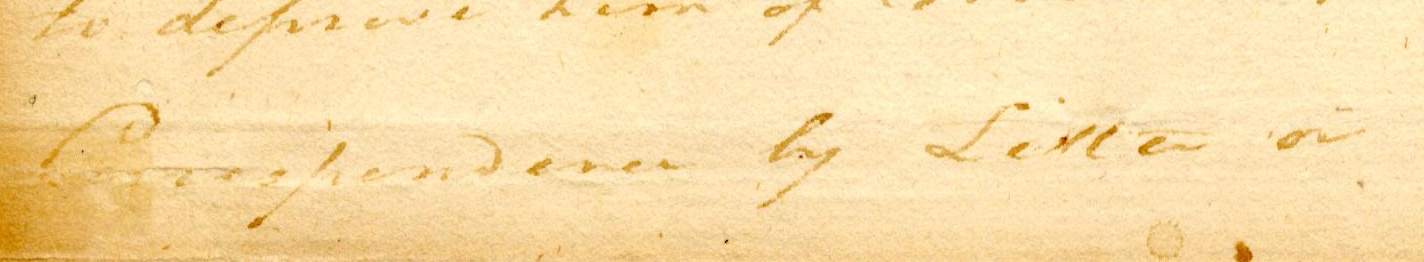Correspondence by Letter or
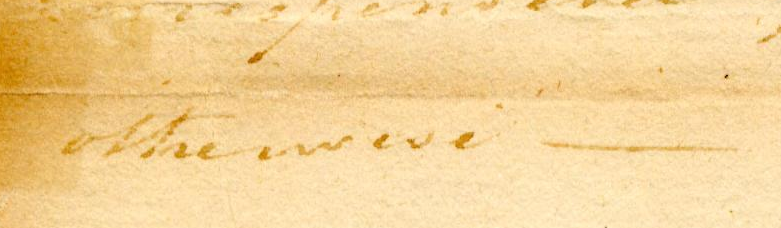otherwise-
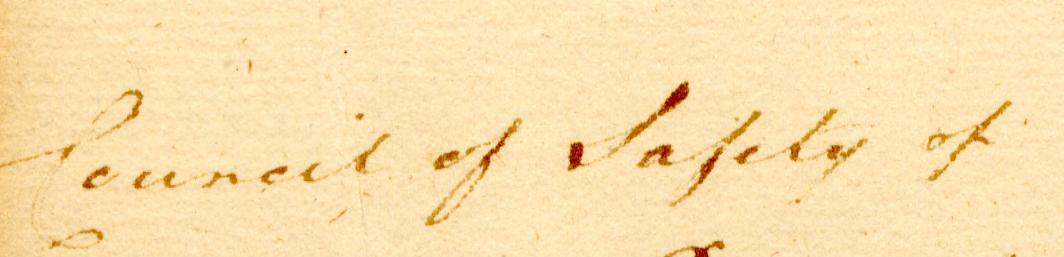Council of Safety of
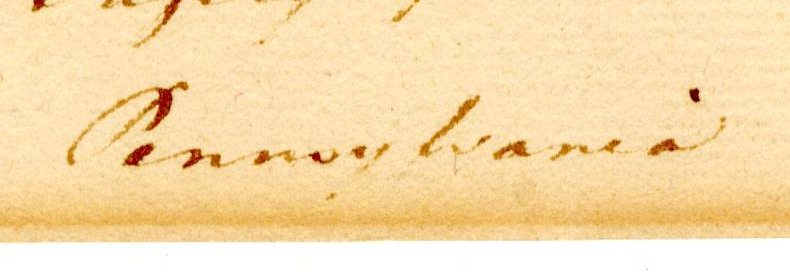Pennsylvania
